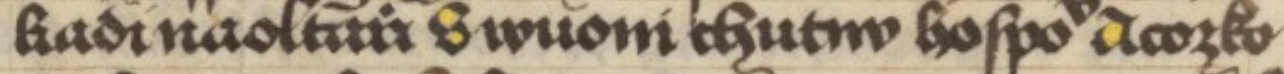kadi naoltaṙi S wuoni chutnv hoſpov Acozko-
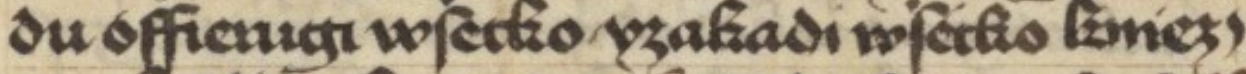du offierugi wẛecko yzakadi wẛecko kniez
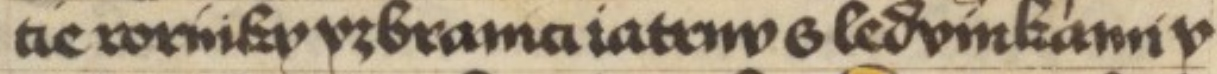tie rorniky yzbramci iatrnv s ledvinkami y
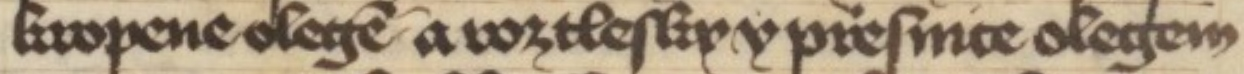kropene olegȇ a roztleſky y pṙeſnice olegem
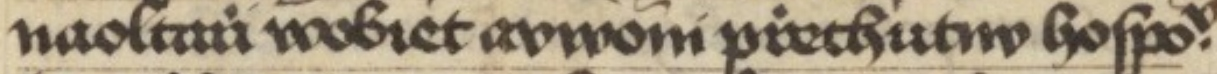naoltaṙi wobiet avwoni pṙechutny hoſpo.v
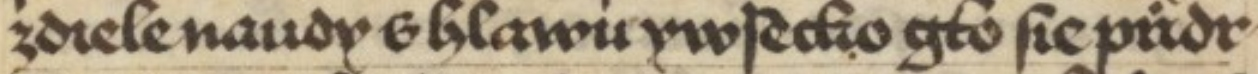zdiele naudy s hlawu ywẛecko g̑to ſie pṙidr-
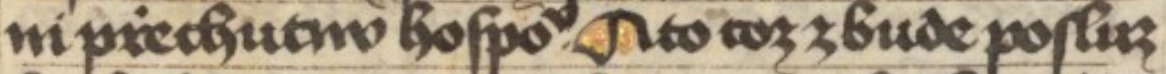ni pṙechutnv hoſpo.v Ato coz zbude poſluz-
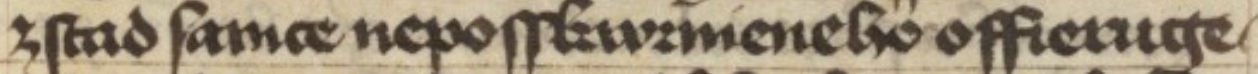zſtad ſamce nepoſſkwrnieneho offieruge
